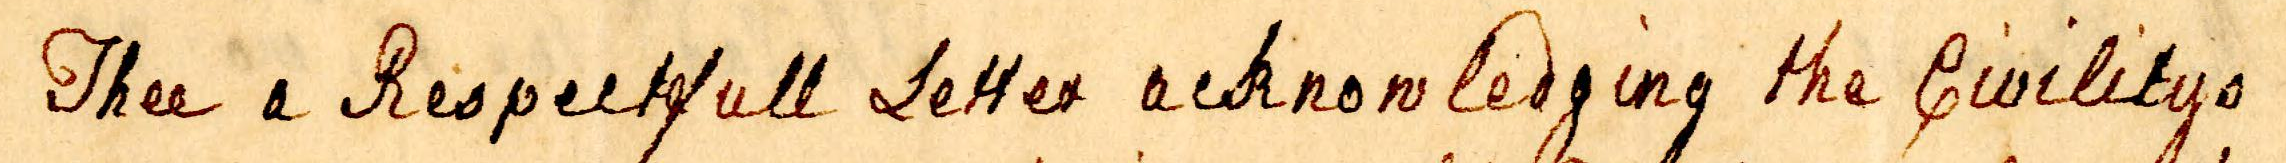Thee a Respectfull Letter acknowledging the Civilitys
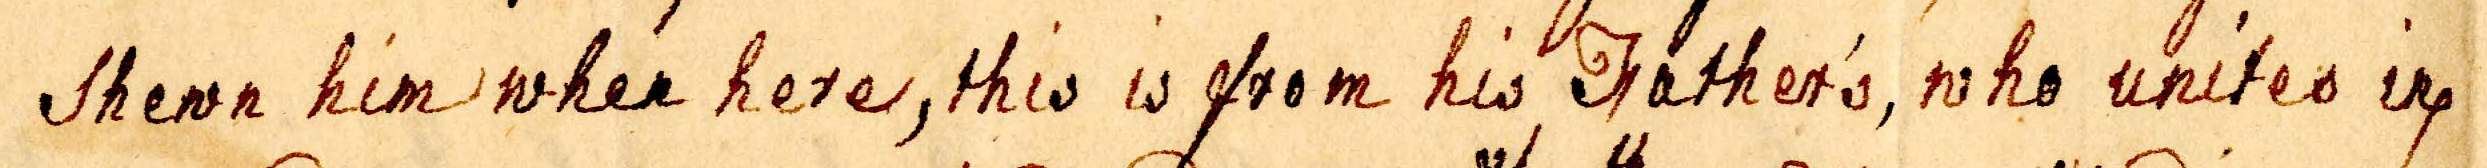shewn him when here, this is from his Father's who unites in
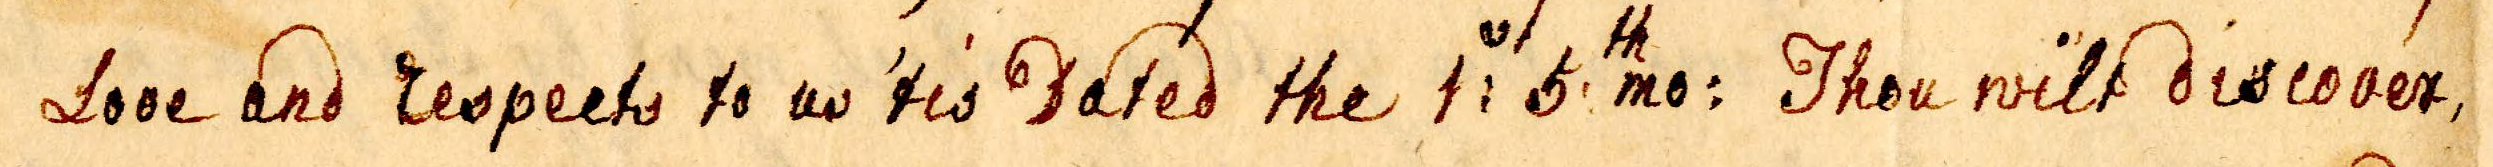Love and respects to us 'tis Dated the 1^st: 5^th: mo: Thou will discover
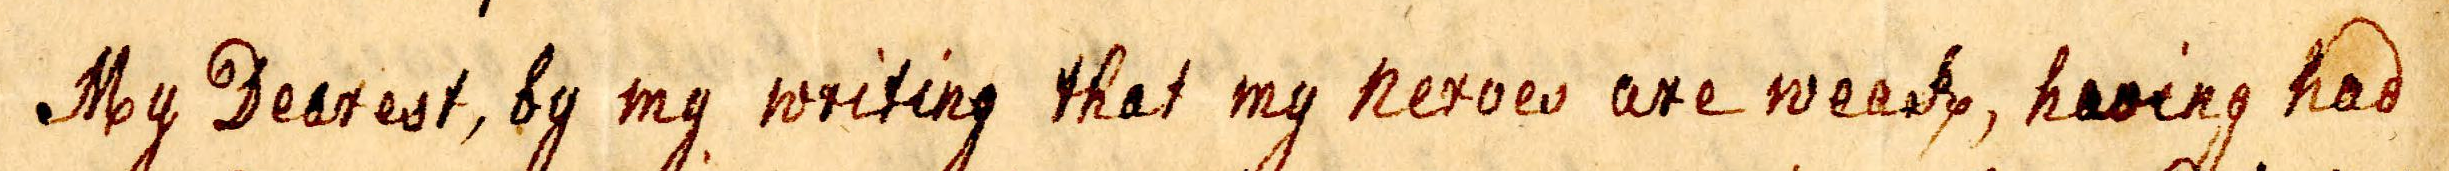My Dearest, by my writing that my nerves are weak, having had
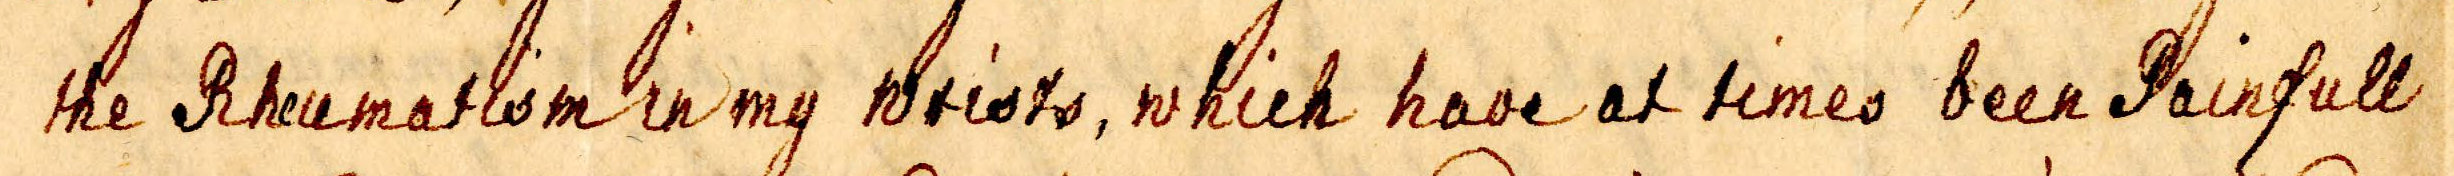the Rheumatism in my wrists, which have at times been Painfull
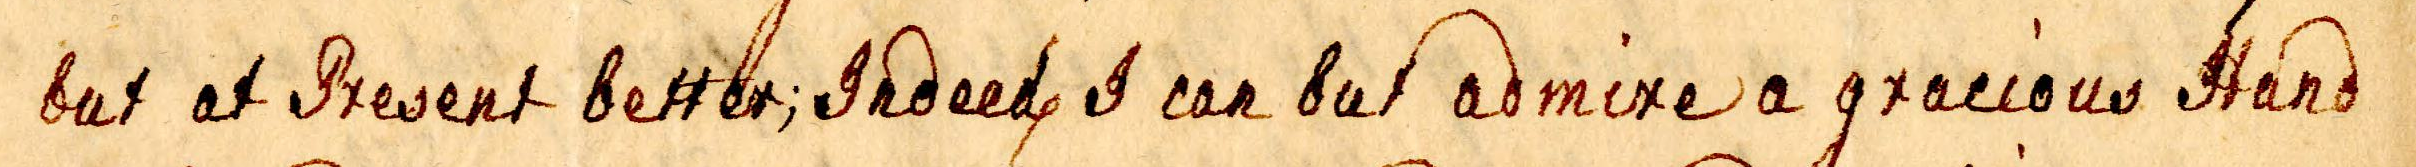but at Present better; Indeed I can but admire a gracious Hand
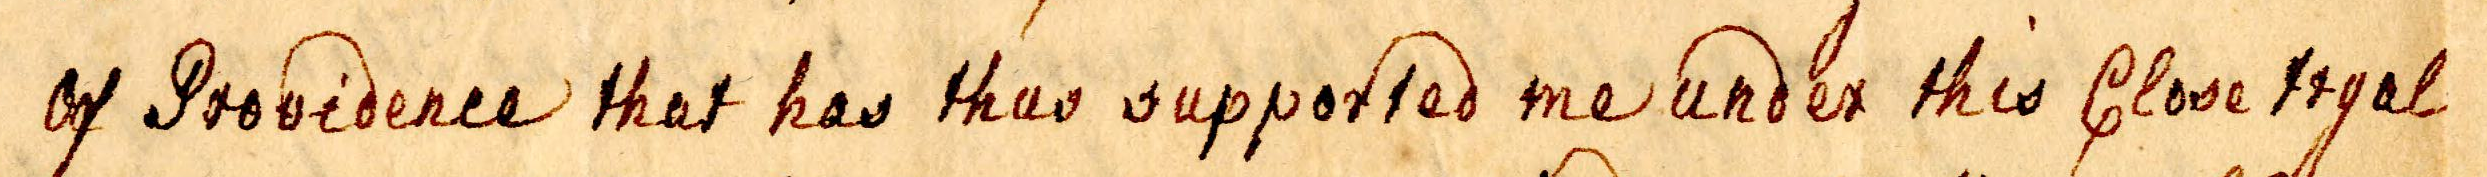of Providence that has thus supported me under this Close tryal
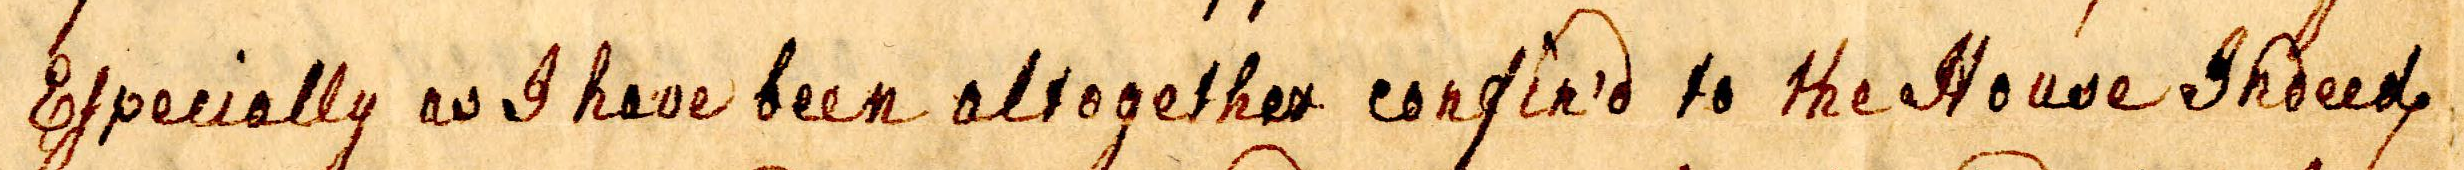Especially as I have been altogether confin'd to the House Indeed.
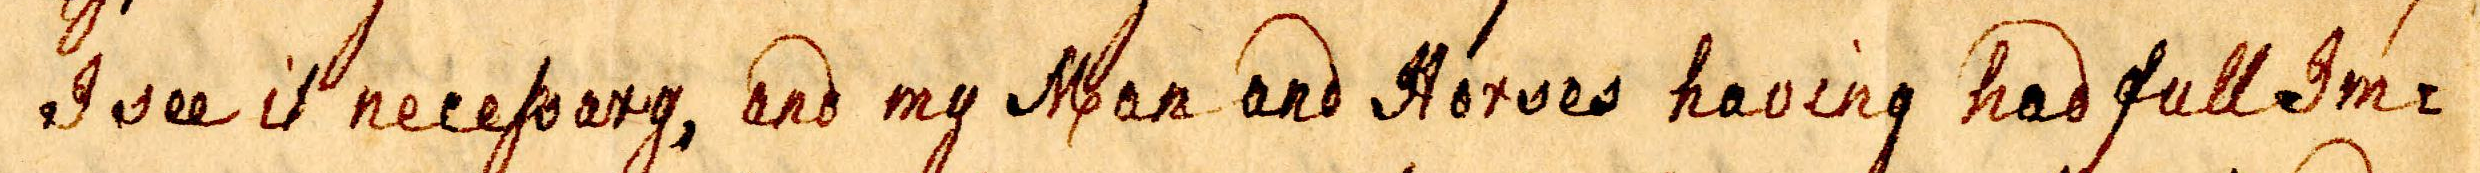I see it necessary, and my Man and Horses having had full Im-
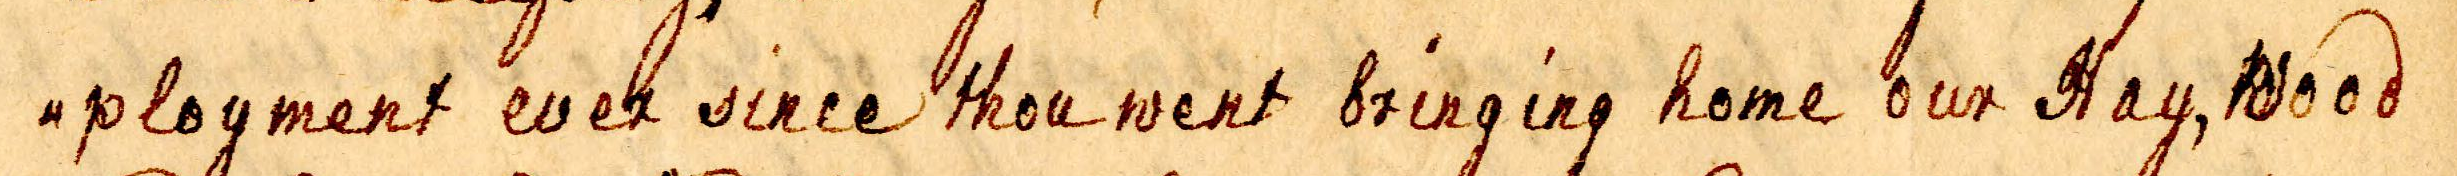-ployment ever since thou went bringing home our Hay, Wood
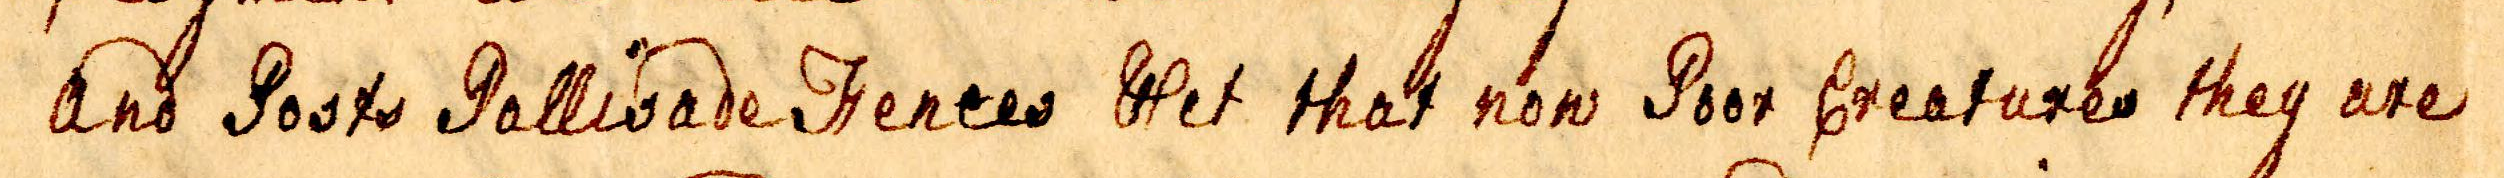and Posts Pallisade Fences Yet that now Poor Creatures they are
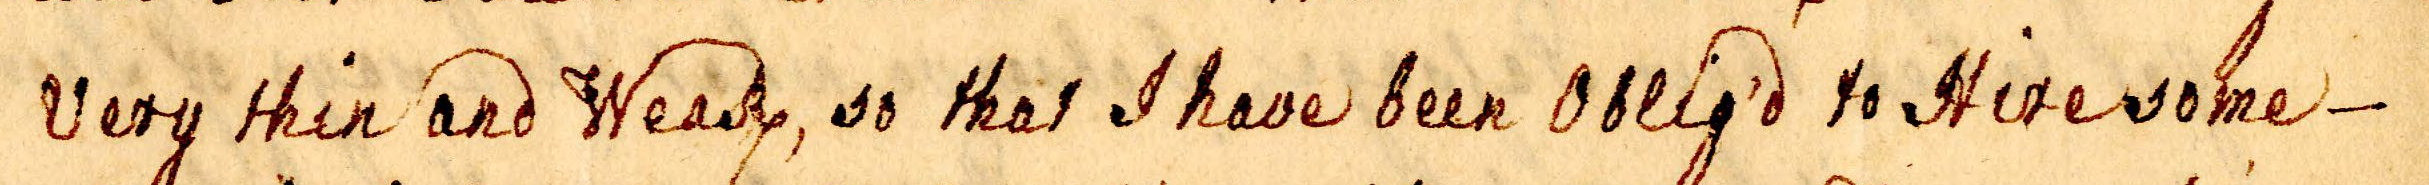very thin and Weak, so that I have been oblig'd to Hire some-
